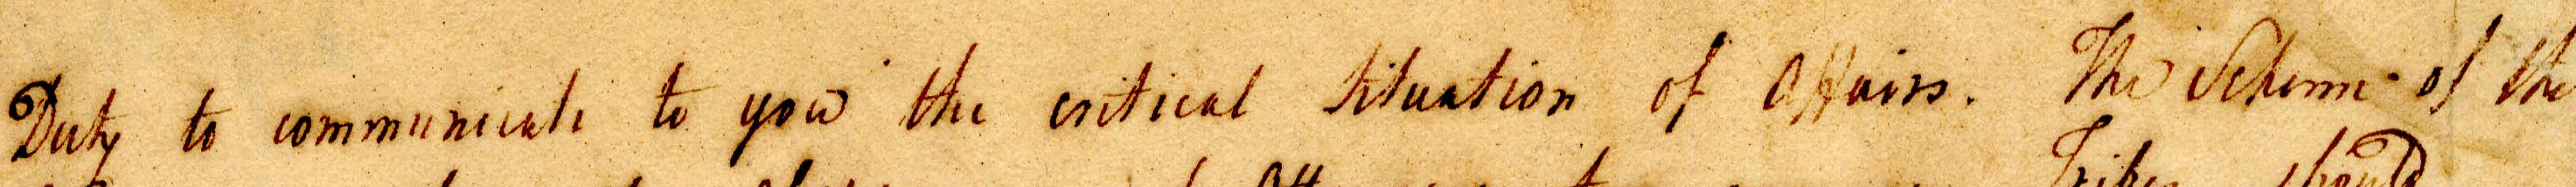Duty to communicate to you the critical Situation of Affairs. The Scheme of the
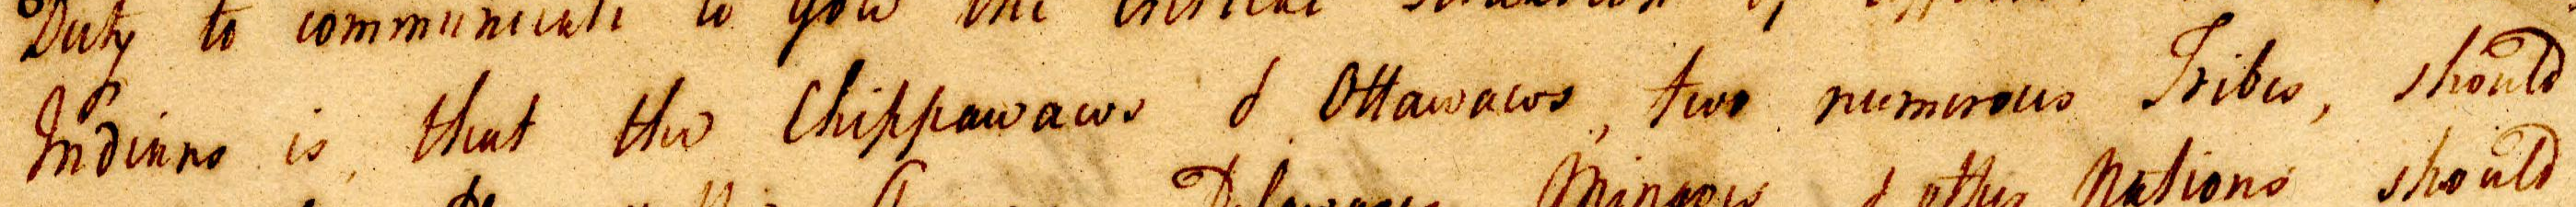Indians is that the Chippawaws & Ottawaws, two numerous Tribes, should
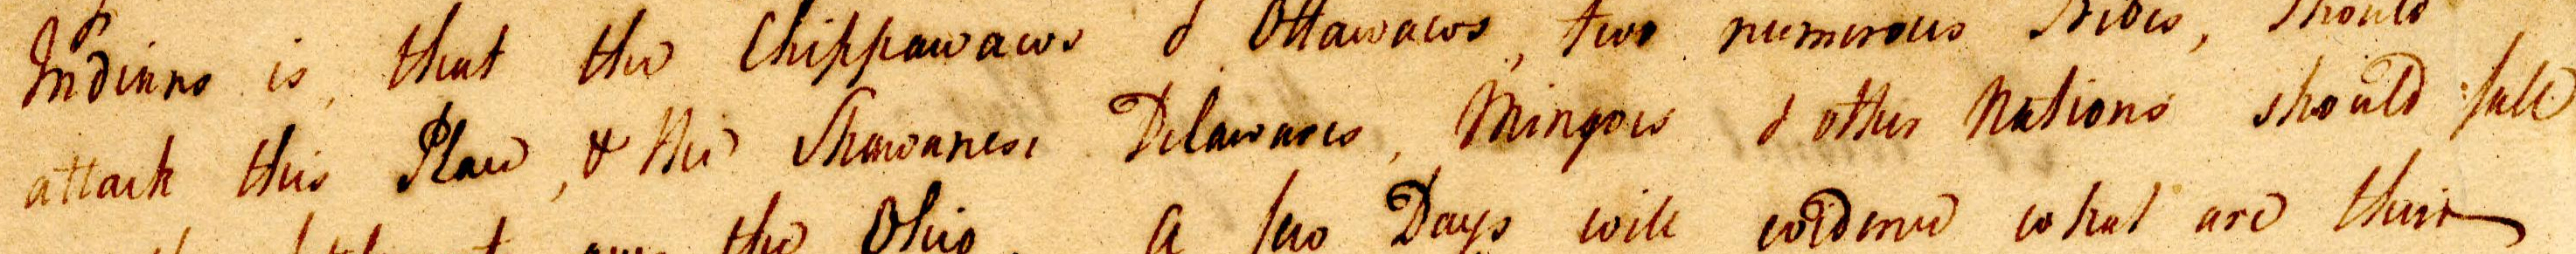attack this Place, & the Shawaneses, Delawares, Mingoes & other Nations should fall
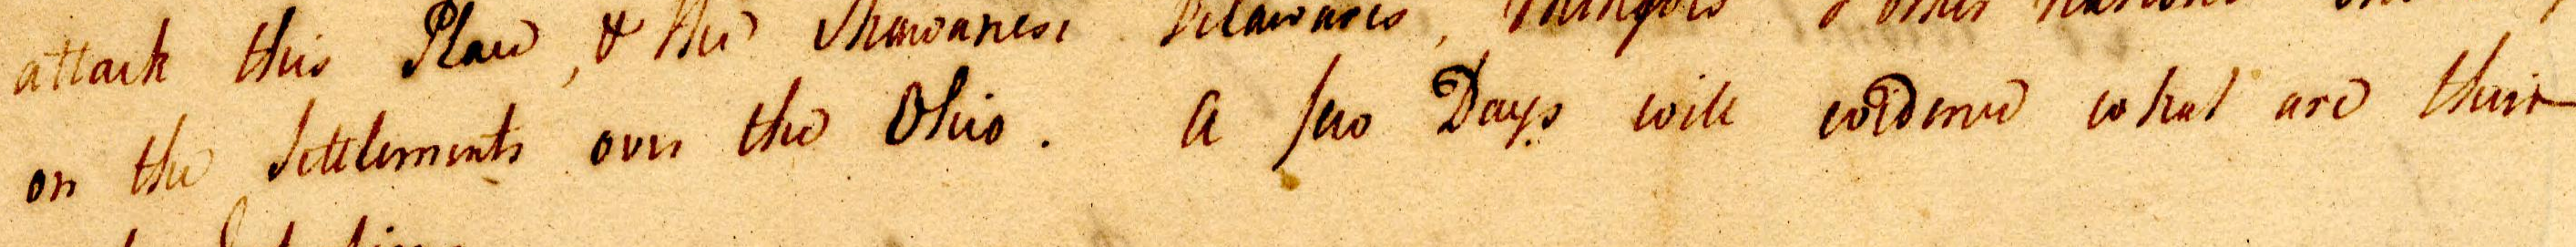on the Settlements over the Ohio. A few Days will evidence what are their
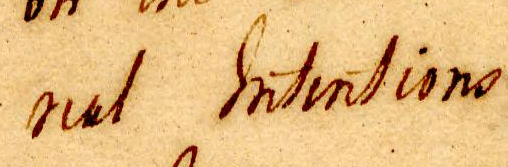real Intentions.
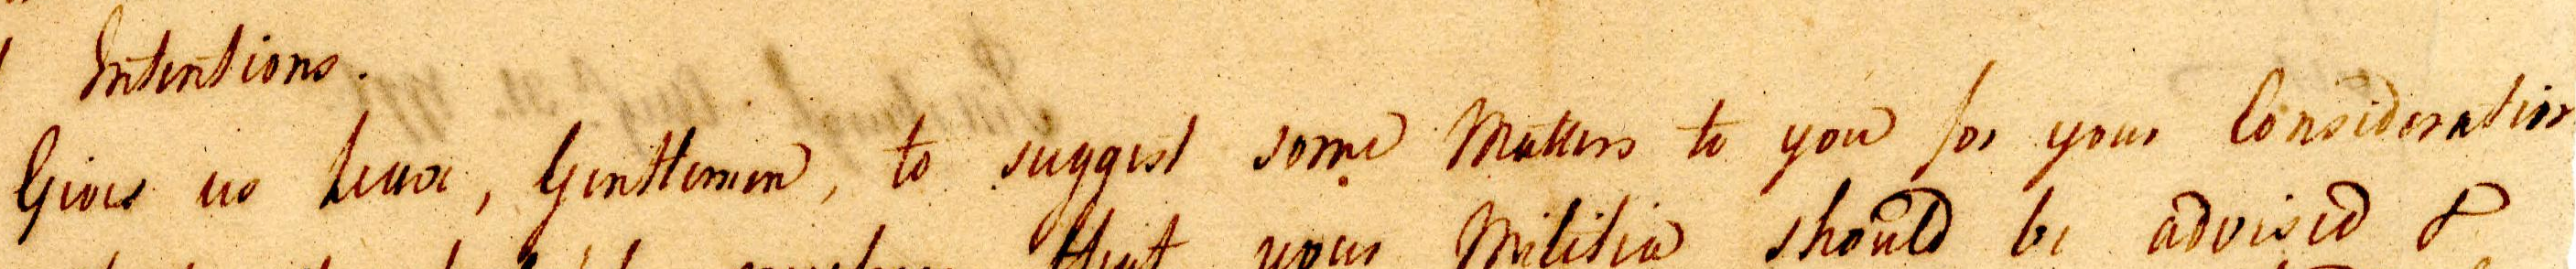Give us Leave, Gentlemen, to suggest some Matters to you for your Consideration
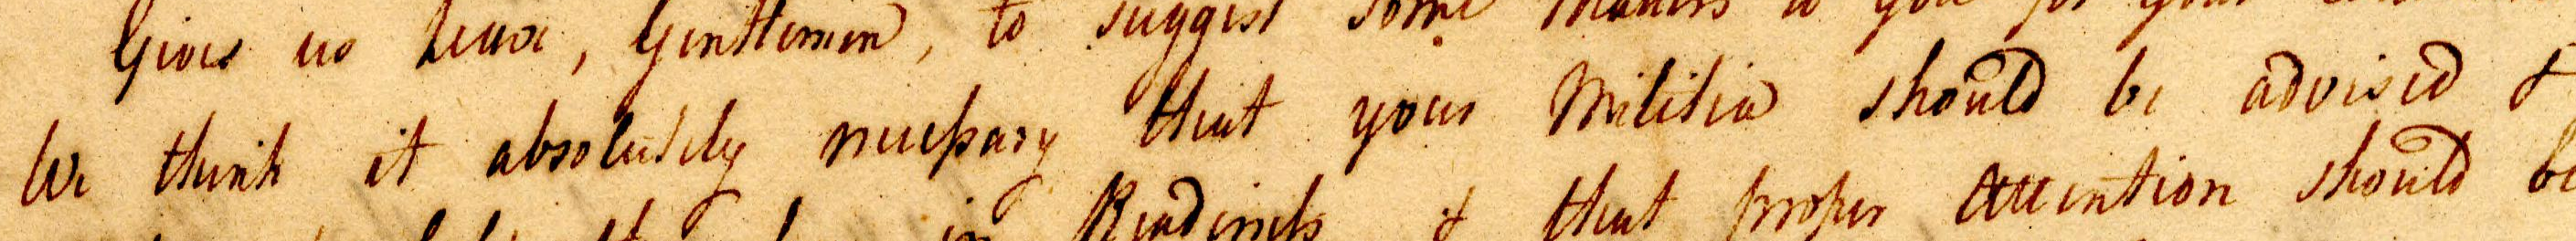We think it absolutely necessary that your Militia should be advised &
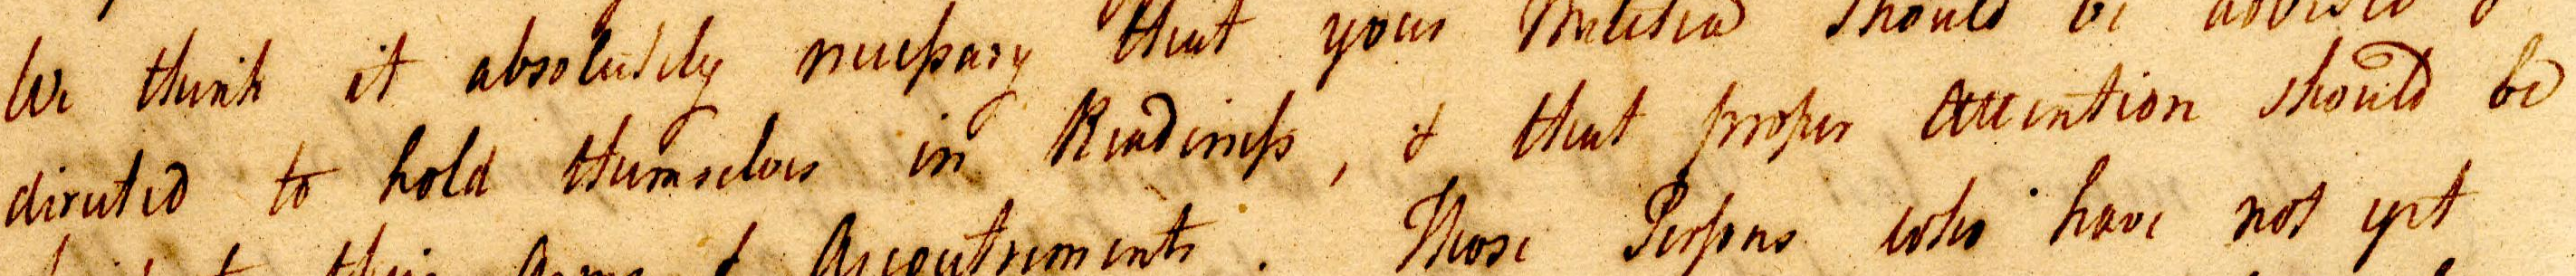directed to hold themselves in Readiness, & that proper attention should be
